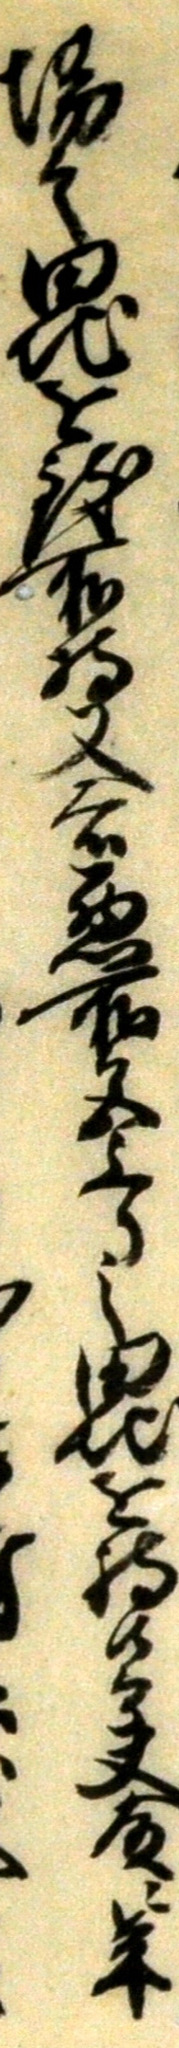場之田地を致所持又者悪所色上り之田地を持候而夫故ニ年
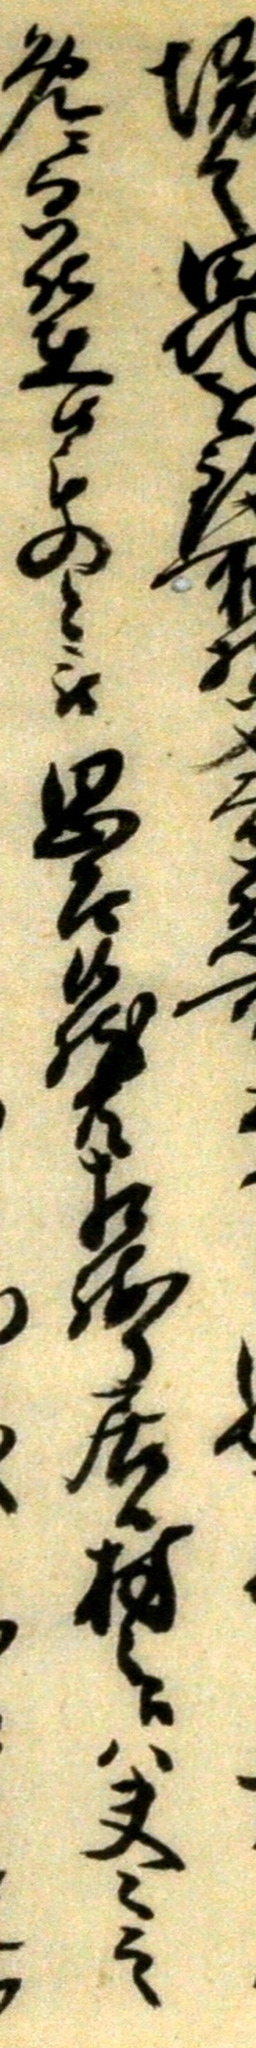免ニ而罷在候ものと被思召候然共相残り居候村々江ハ夫々之
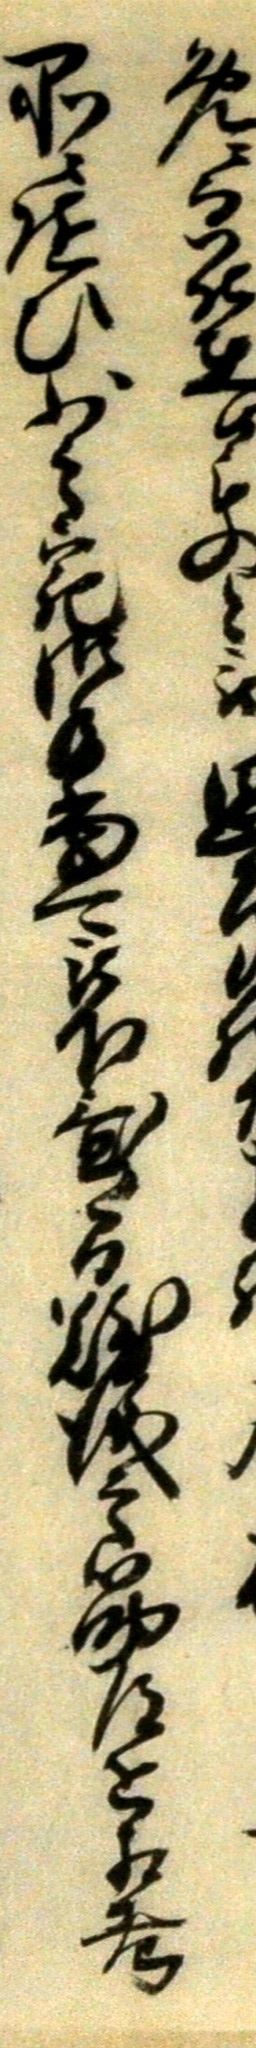品ニ随ひ少々宛御手当可被下置候間難儀之筋道を相考
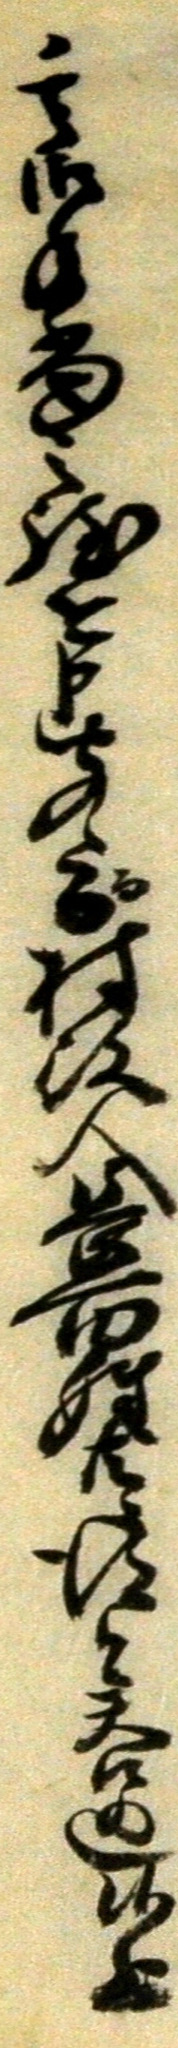其御手当之程を申聞候而村役人長百姓共ニ得呑込候上
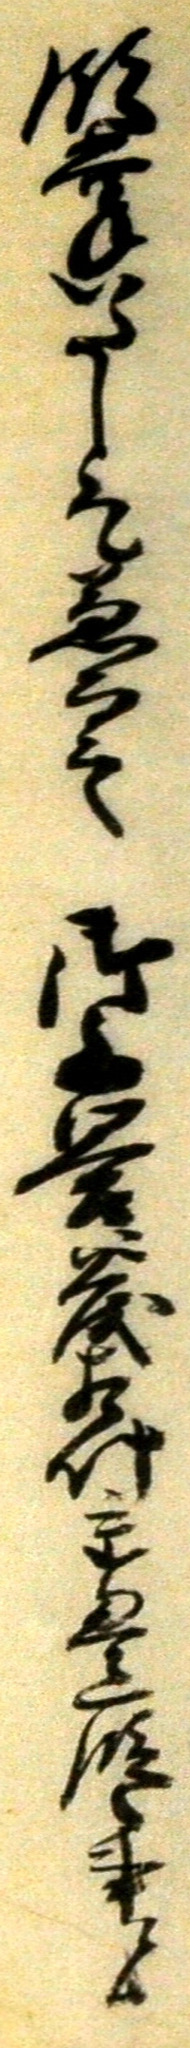領掌いたし候て兼而之御上思召ニ茂相叶重畳一段之事ニ候

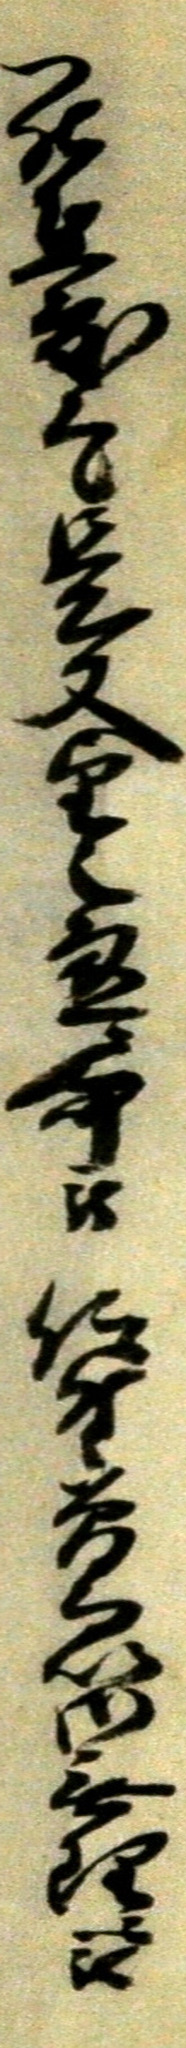罷在度候ハヽ是又望之通ニ可被仰付候曽而以御無理ニ被
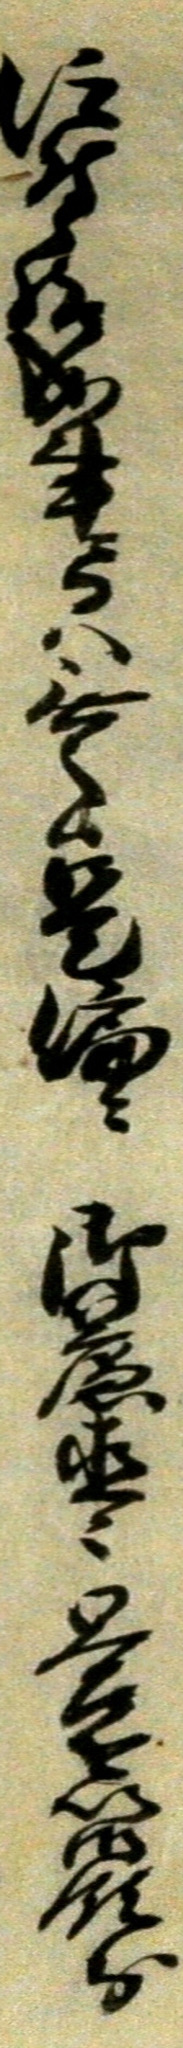仰付候様成事ニ而ハ無之候是偏ニ御廉直之思召を以御領分
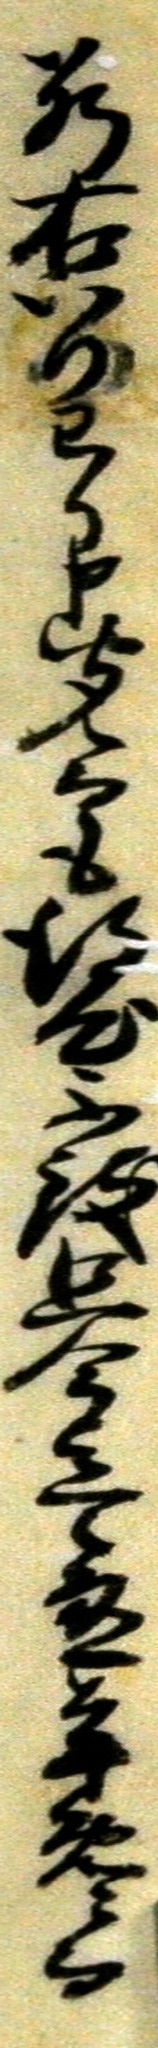若右いつわり申聞候而も得心不致只今迄之通年免ニ而
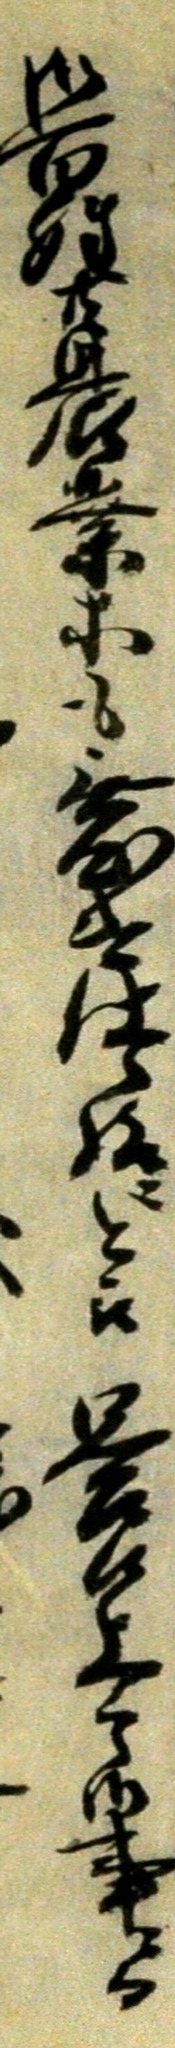御百姓共農業等茂無心遣仕候様ニと被思召候上之御事ニ而
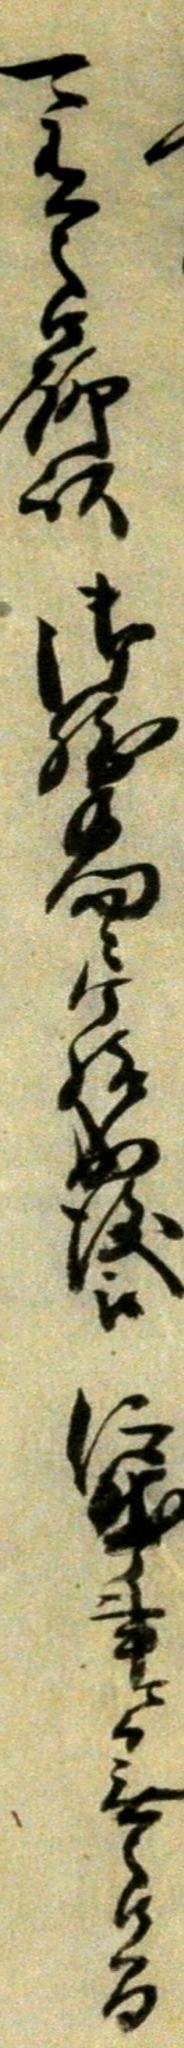可有之候聊以御勝手向ニヶ様成儀被仰出候事ニハ無之候間
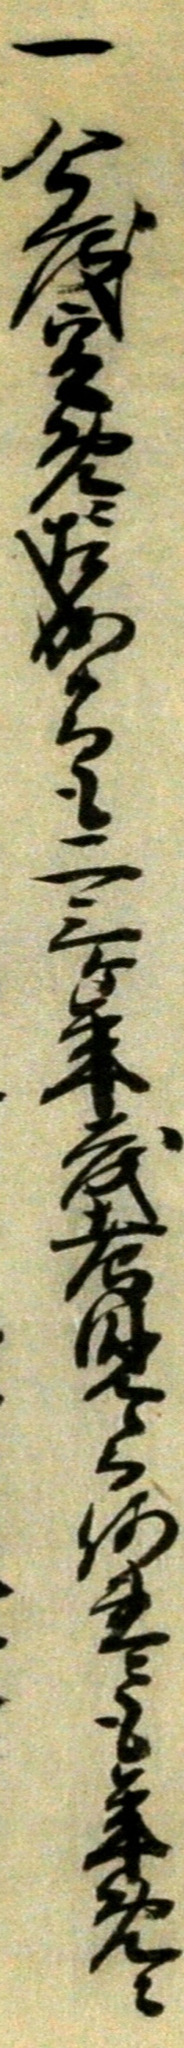一今度定免ニ相成候而もニ三ヶ年茂考見候而何れニも年免ニ
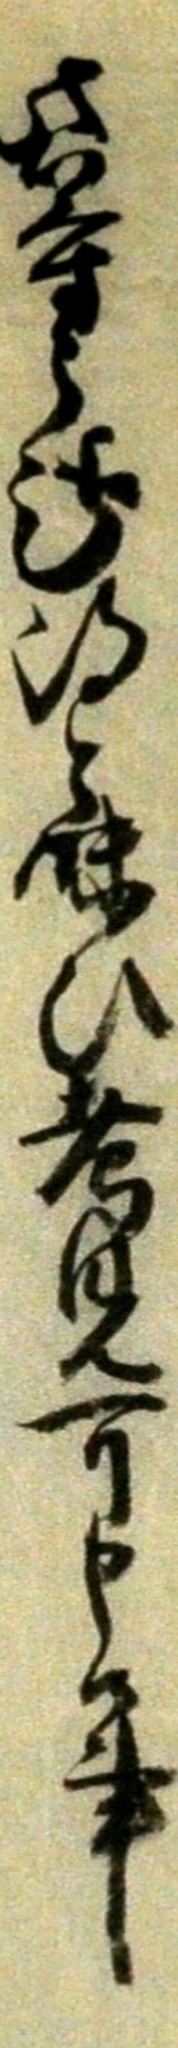此等之趣得と味ひ考見可申候事
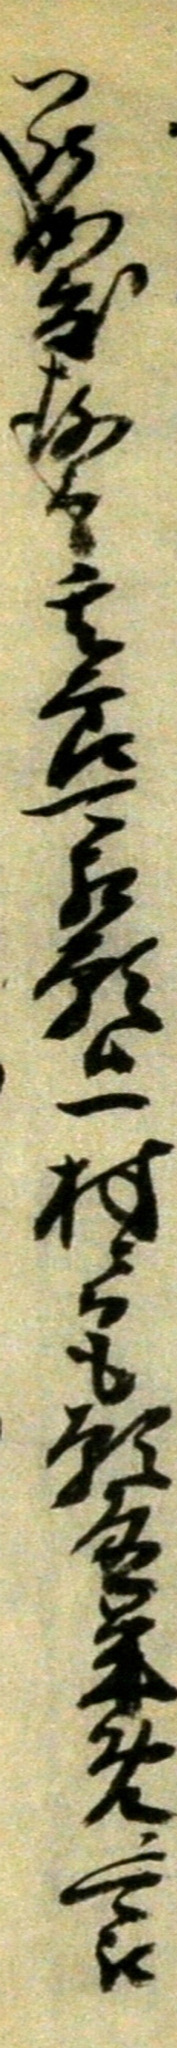罷成度存候ハヽ其節可相願候一村ニ而も願通年免ニ可被
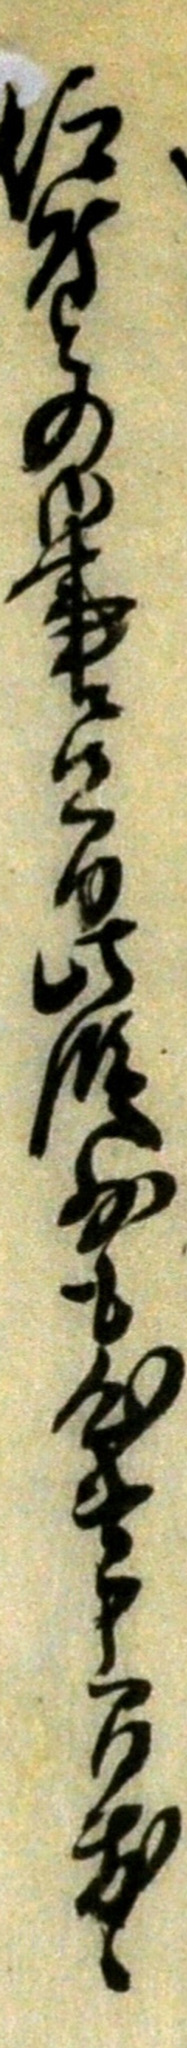仰付との御事ニ候間此段少も心遣間敷候
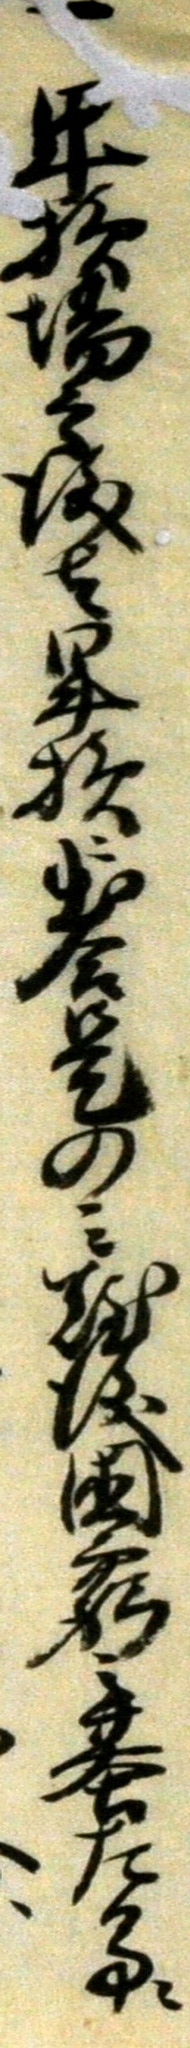一旱損場之儀者旱損ニ出合是のミ難儀困窮之基たる事ニ
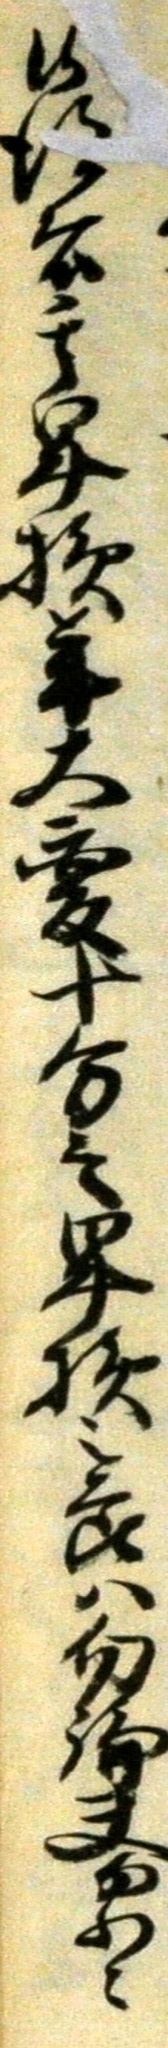候得者其旱損年大変十分之旱損之節ハ勿論夫ゟ少々
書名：留書
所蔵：伊那市立高遠町図書館・合同会社AMANE
